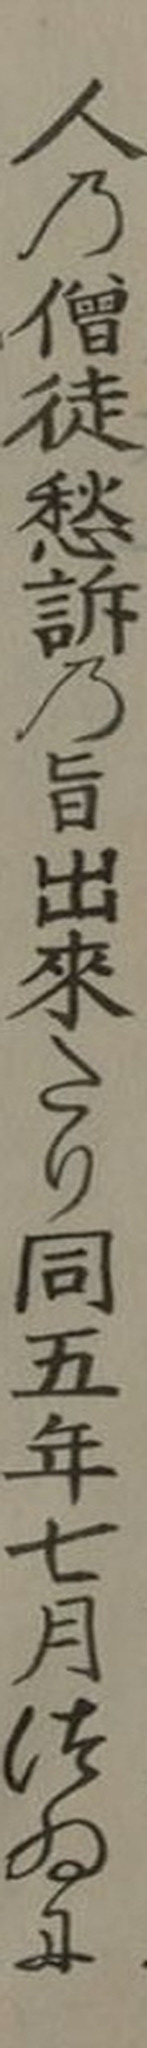人の僧徒愁訴の旨出來たり同五年七月つゐに
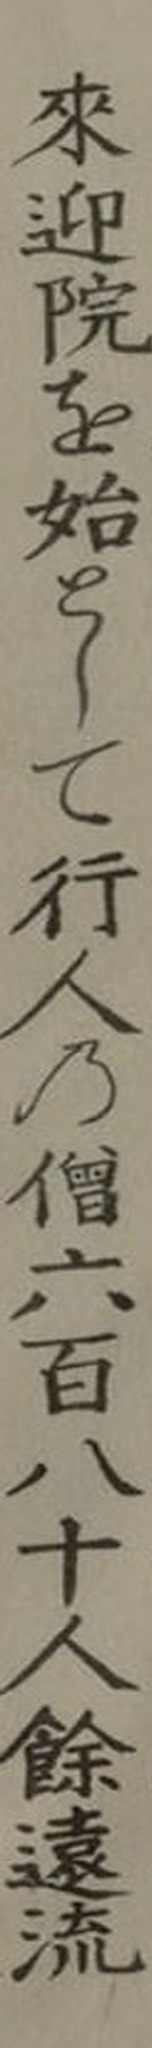來迎院を始として行人の僧六百八十人餘遠流
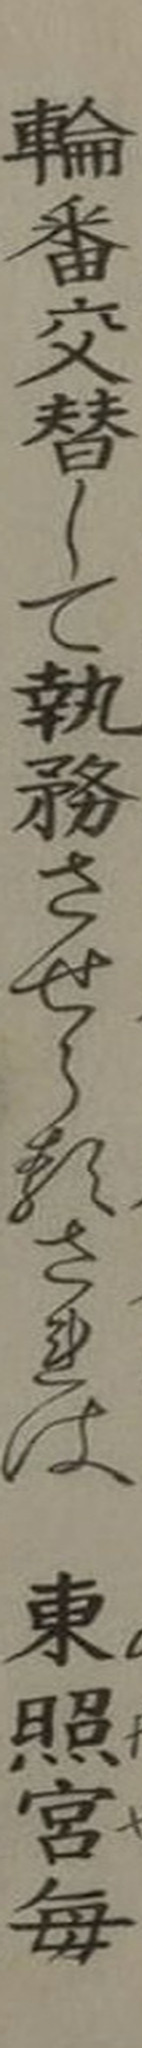輪番交替して執務させらるされは東照宮毎
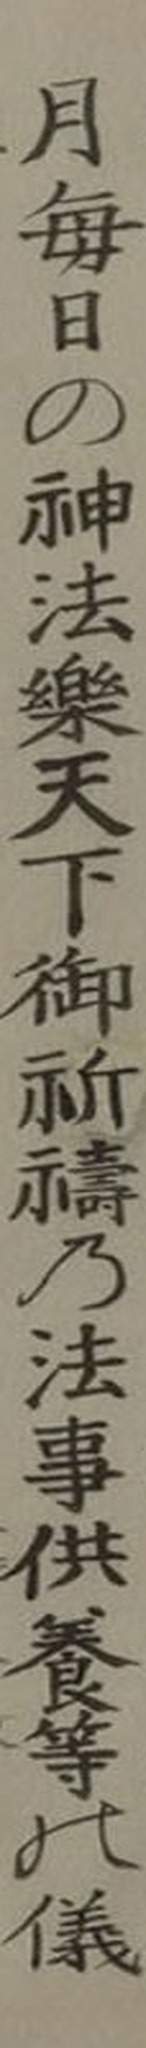月毎日の神法樂天下御祈禱の法事供養等の儀
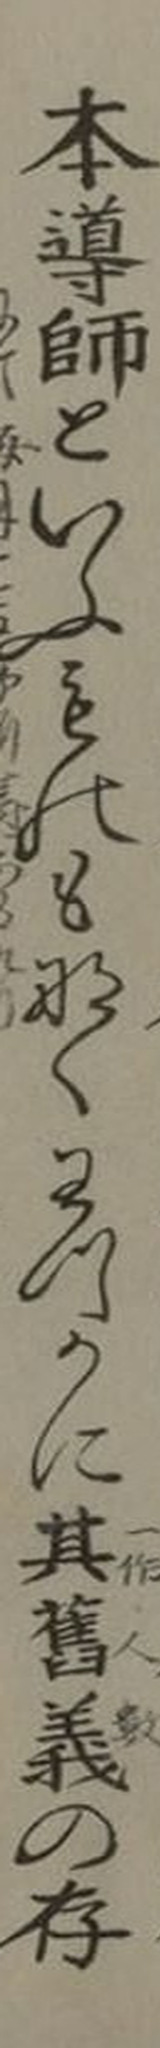本導師といふものもなくわつかに其舊義の存
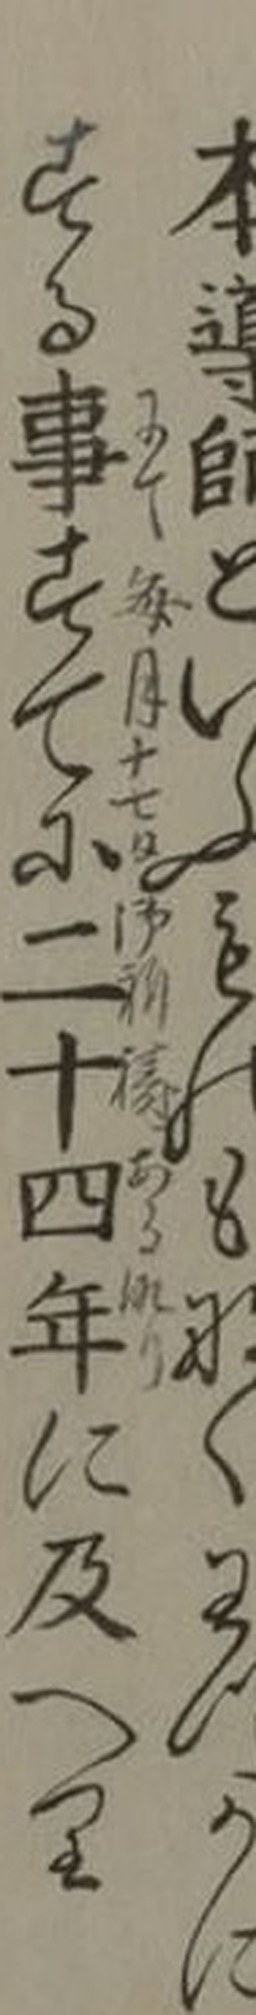する事すてに二十四年に及へり

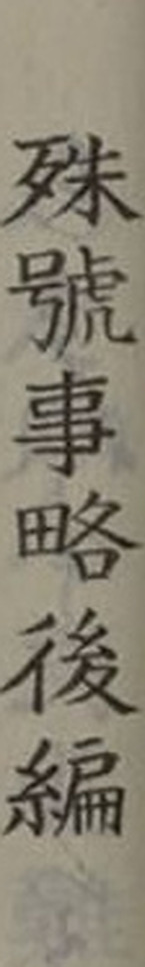殊號事略後編
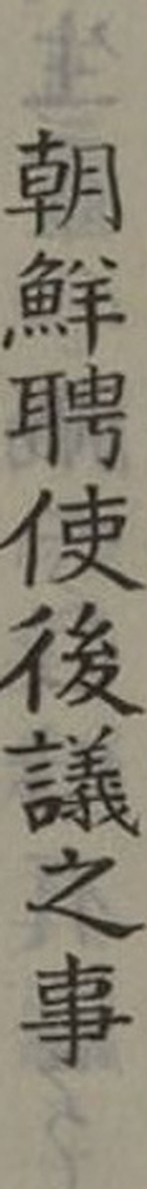朝鮮聘使後議之事
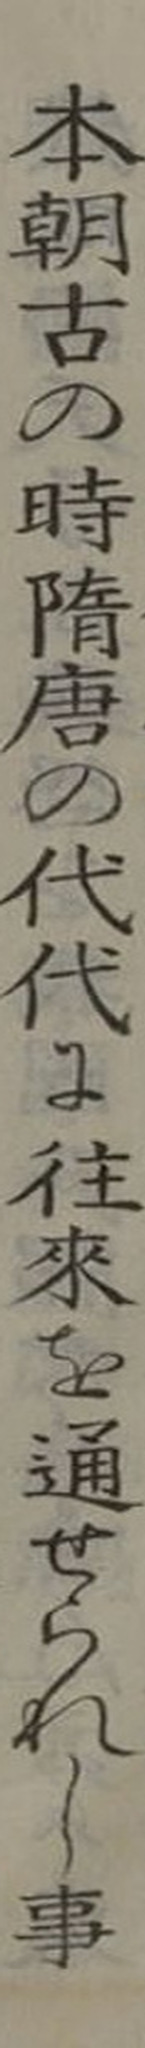本朝古の時隋唐の代代に往來を通せられし事
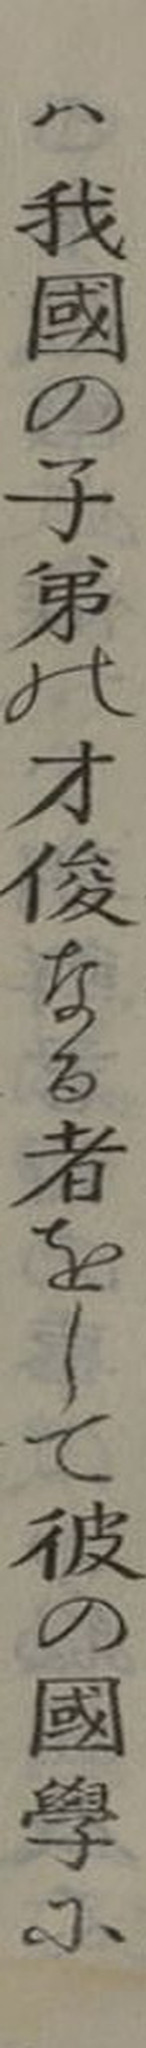は我國の子弟の才俊なる者をして彼の國學に
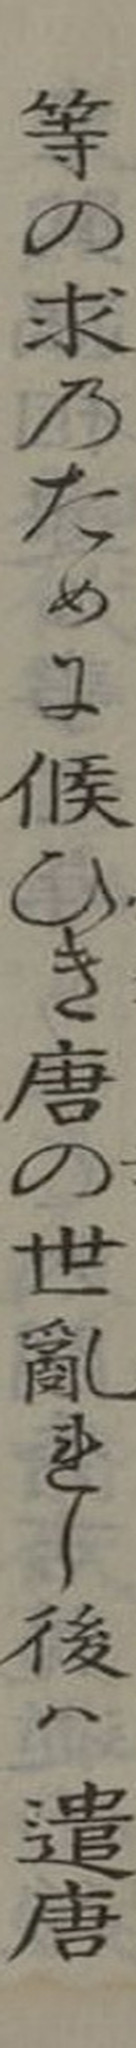等の求のために候ひき唐の世亂れし後は遣唐
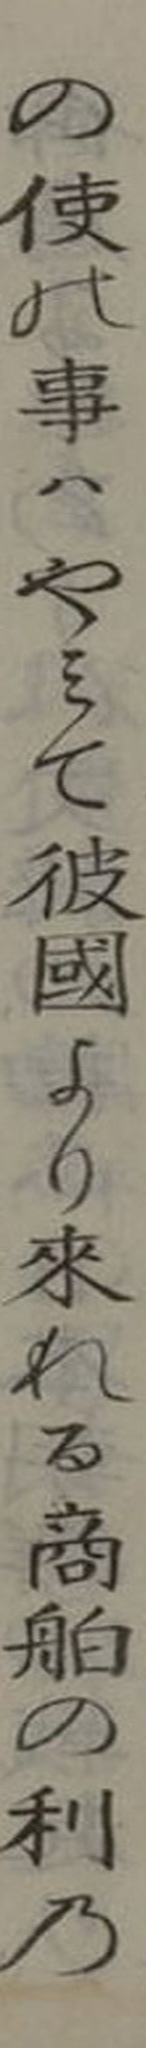の使の事はやみて彼國より來れる商舶の利の
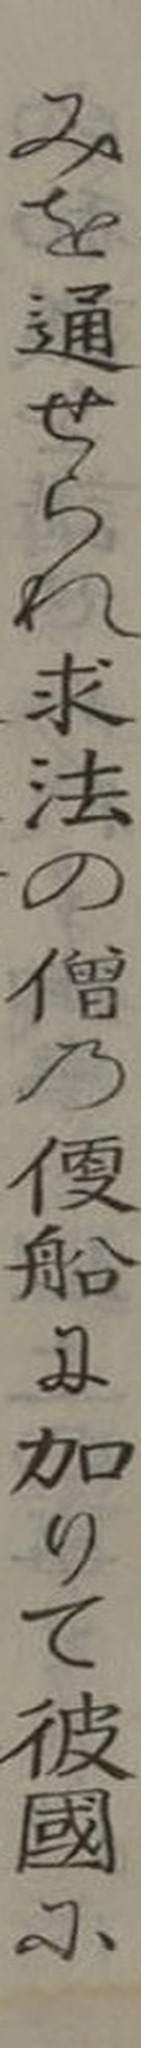みを通せられ求法の僧の船に加りて彼國に
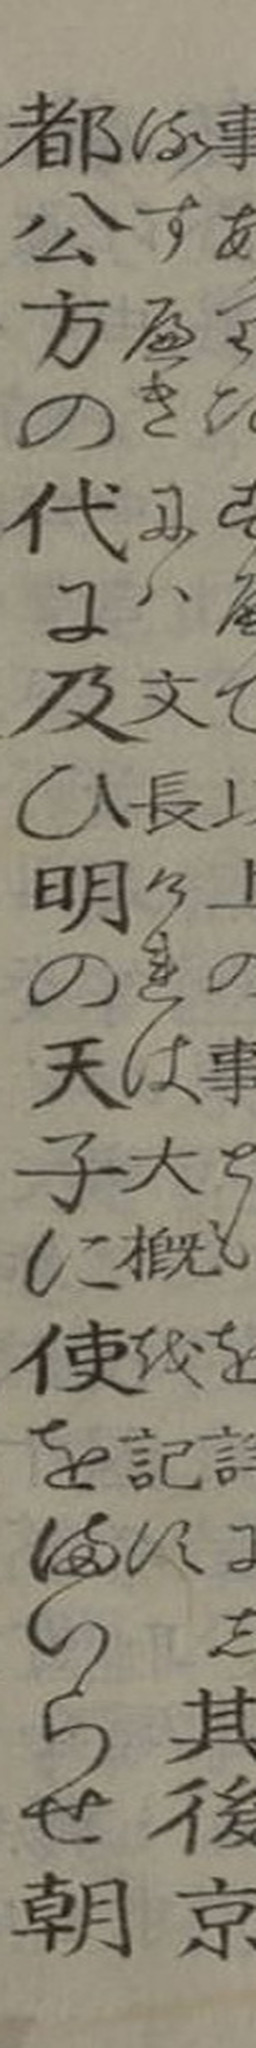都公方の代に及ひ明の天子に使をまいらせ朝
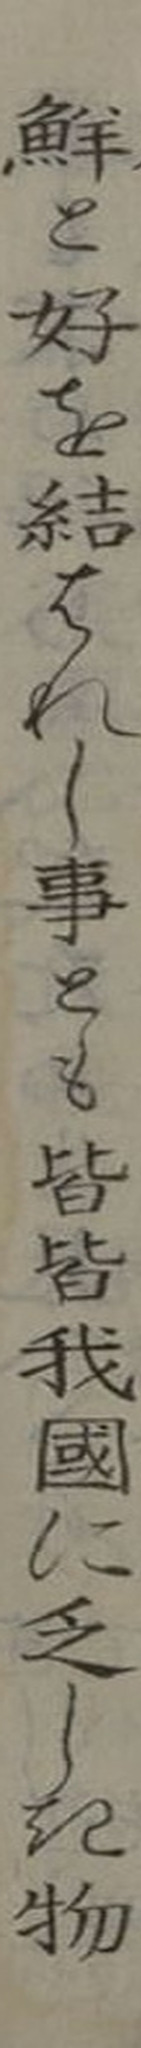鮮と好を結はれし事とも皆皆我國に乏しき物

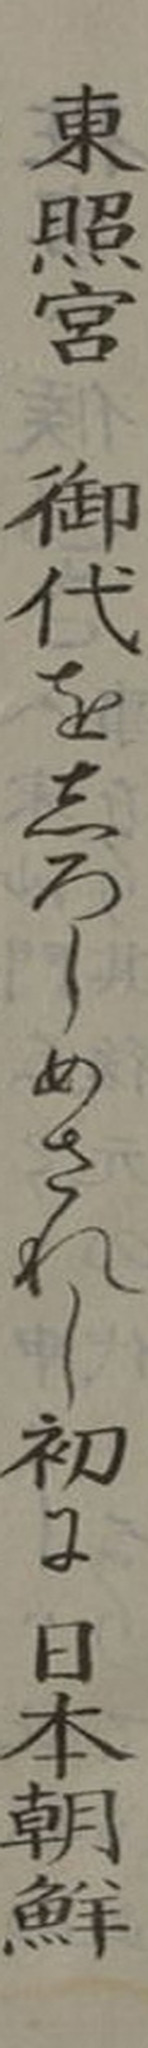東照宮御代をしろしめされし初に日本朝鮮
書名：骨董録
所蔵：University of the Ryukyus Library
